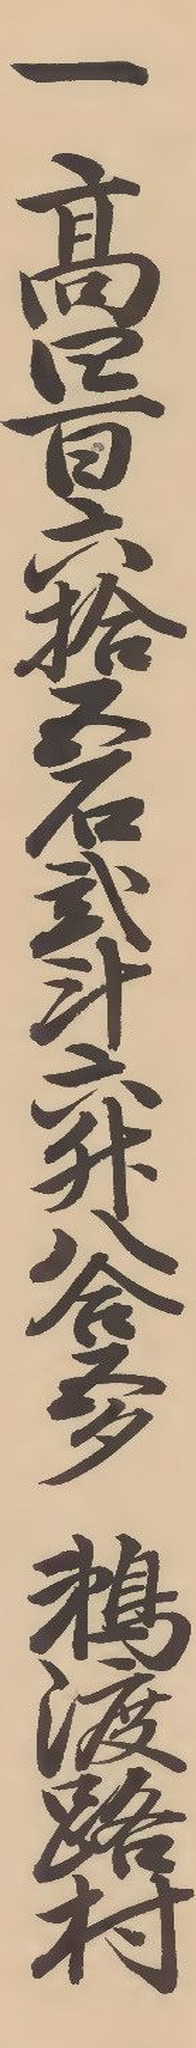一高四百六拾五石弐斗六升八合五勺鵜渡路村
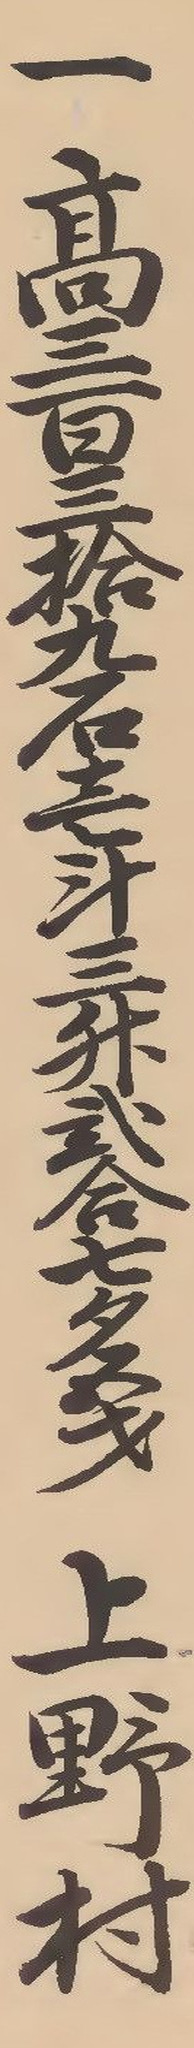一高三百三拾九石壱斗三升弐合七タ五才上野村
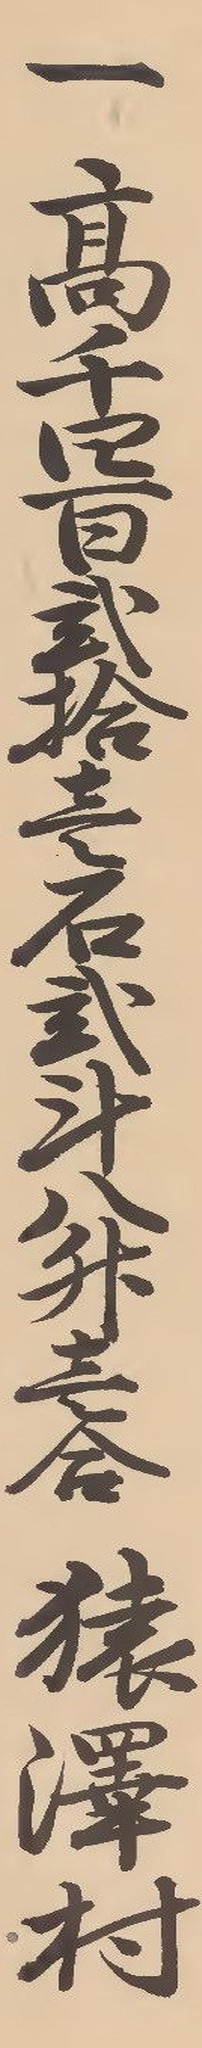一高千四百弐拾壱石弐斗八升壱合猿沢村
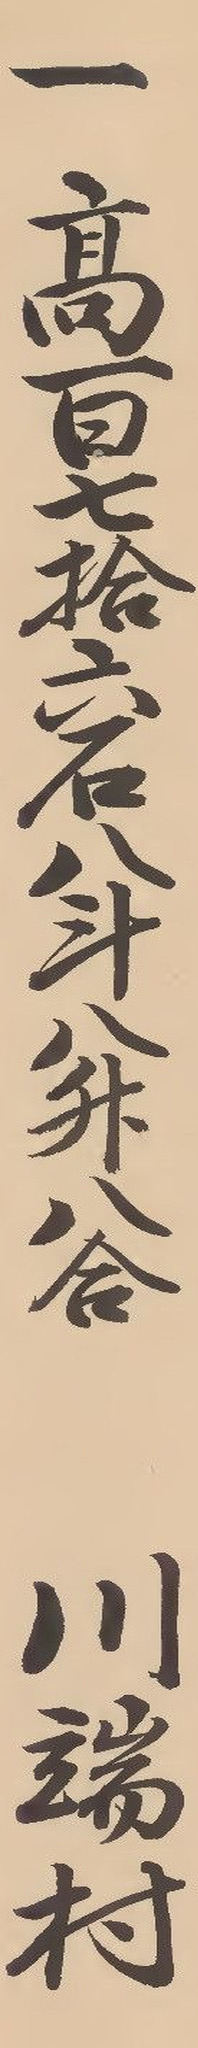一高百七拾六石八斗八升八合川端村
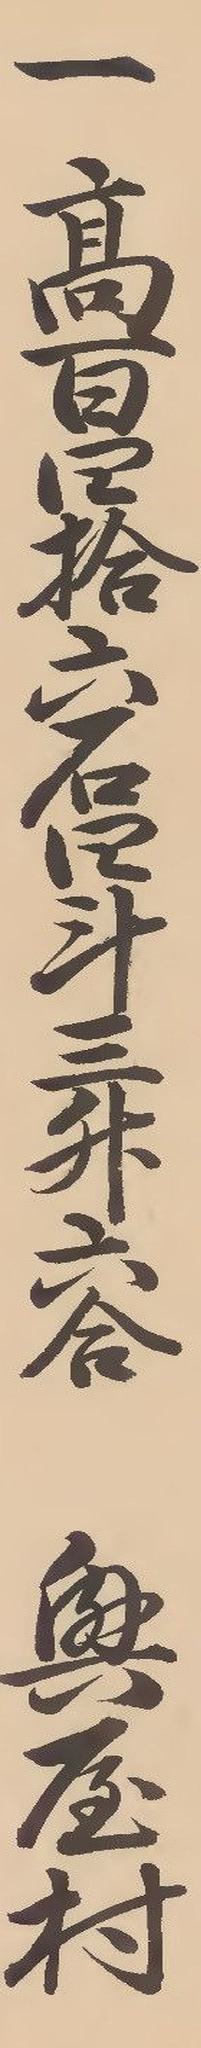一高百四拾六石四斗三升六合興屋村
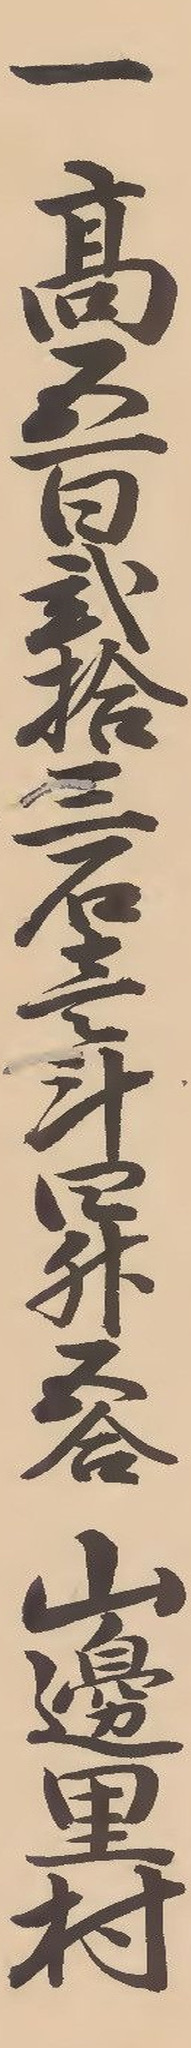一高五百弐拾三石壱斗四升五合山辺里村

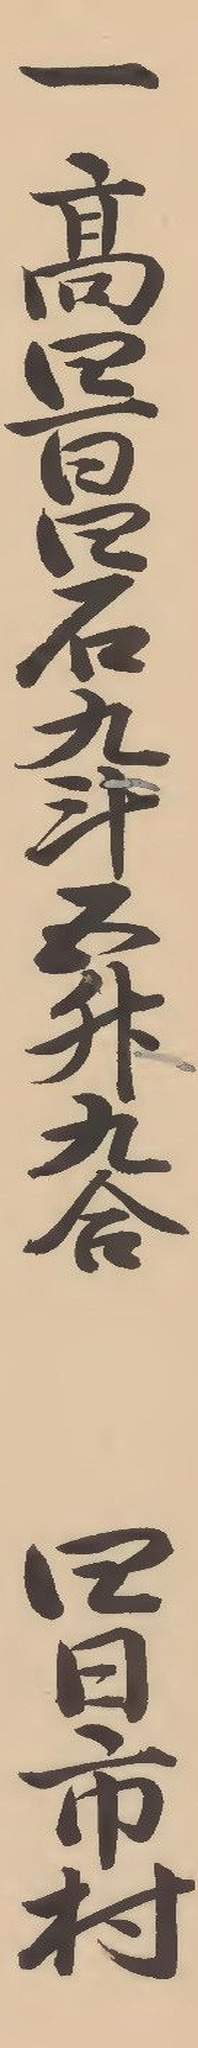一高四百四石九斗五升九合四日市村
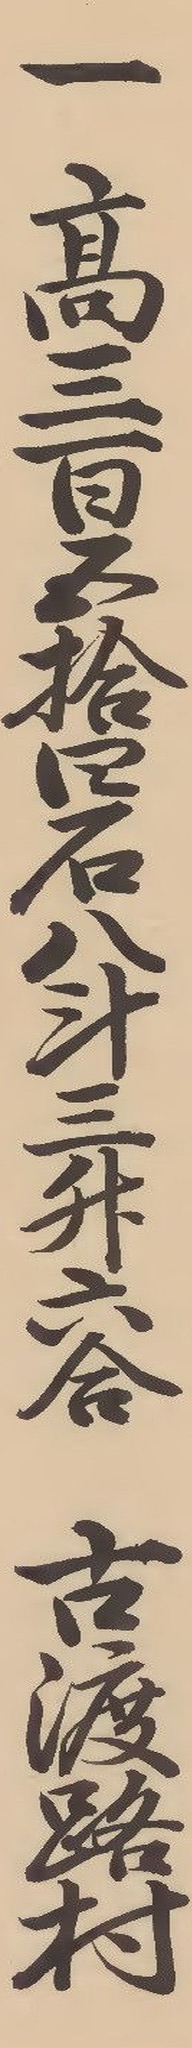一高三百五拾四石八斗三升六合古渡路村
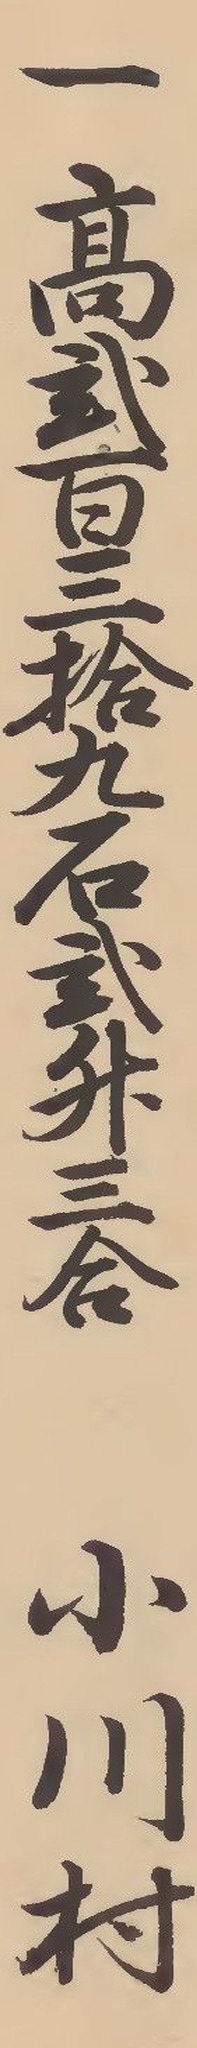一高弐百三拾九石弐升三合小川村
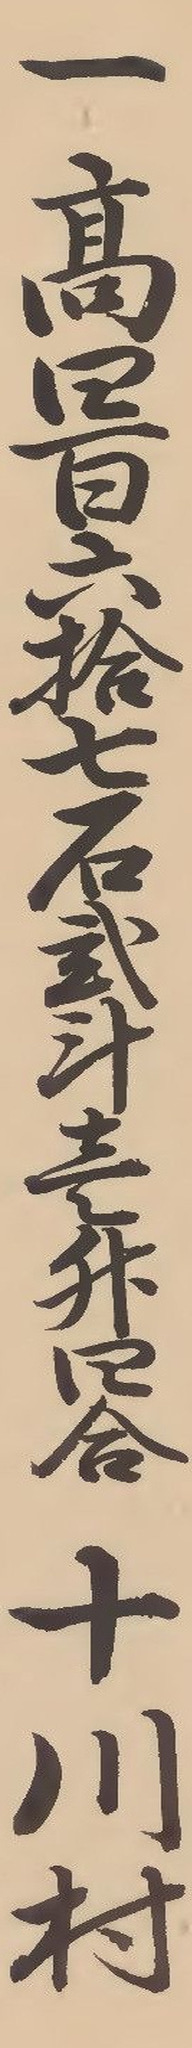一高四百六拾七石弐斗壱升四合十川村
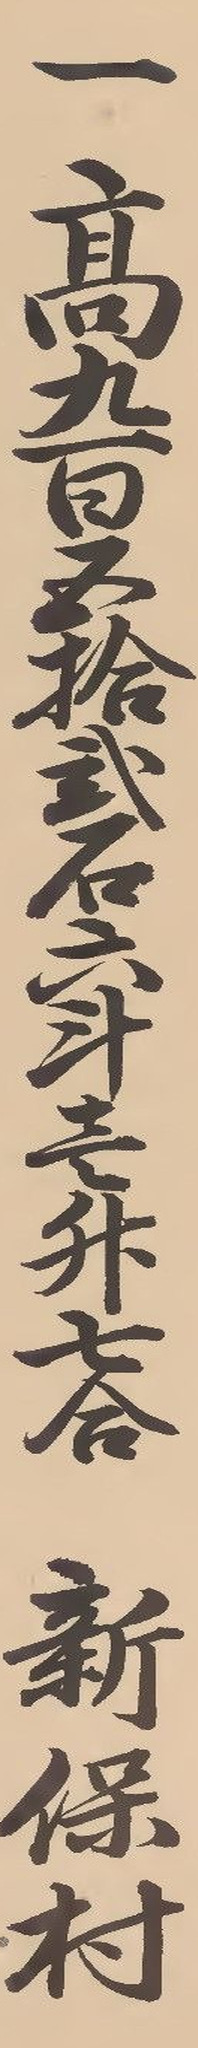一高九百五拾弐石六斗壱升七合新保村
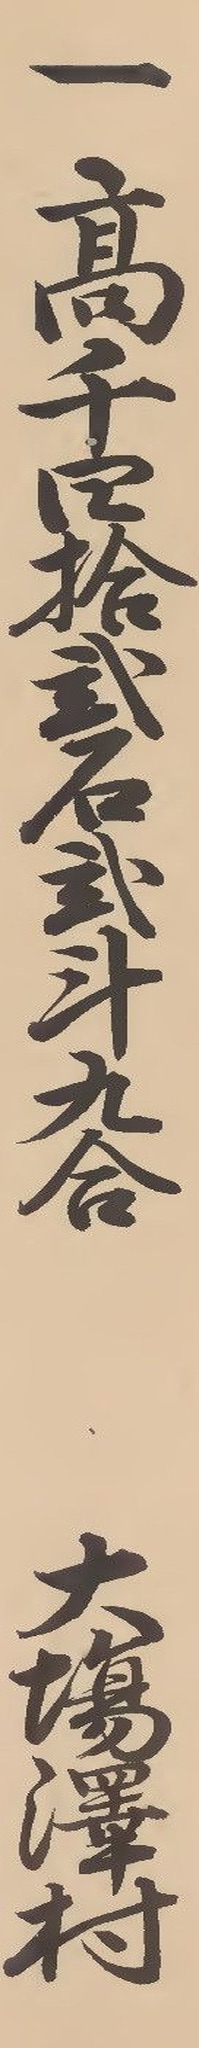一高千四拾弐石弐斗九合大場沢村
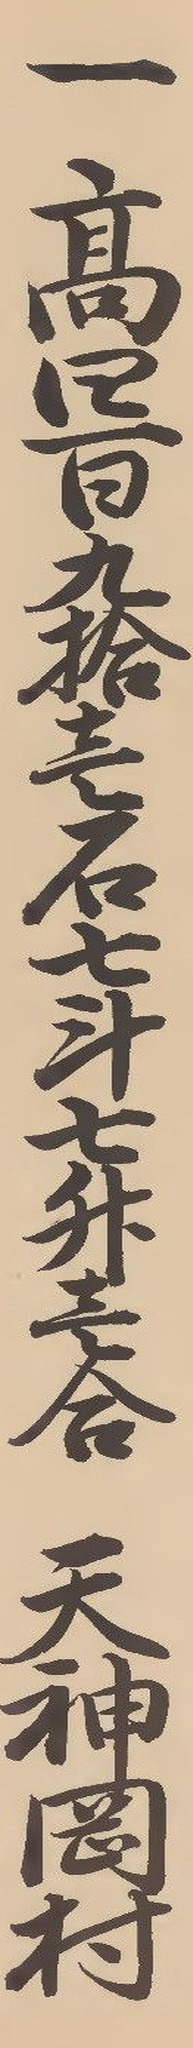一高四百九拾壱石七斗七升壱合天神岡村
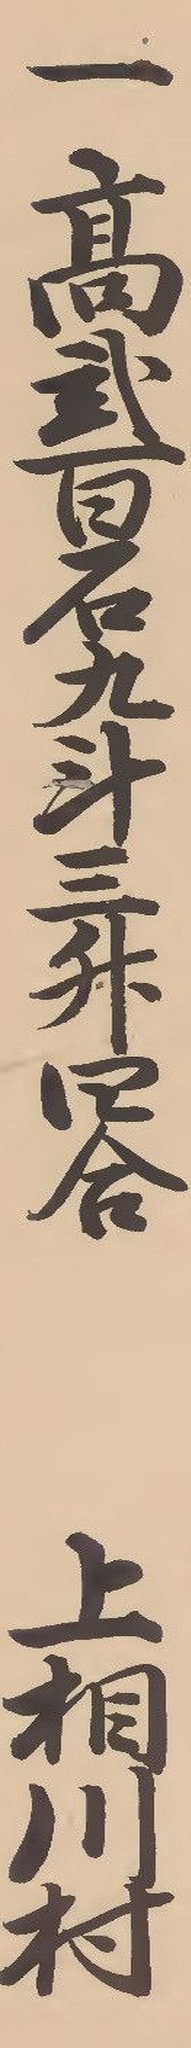一高弐百石九斗三升四合上相川村

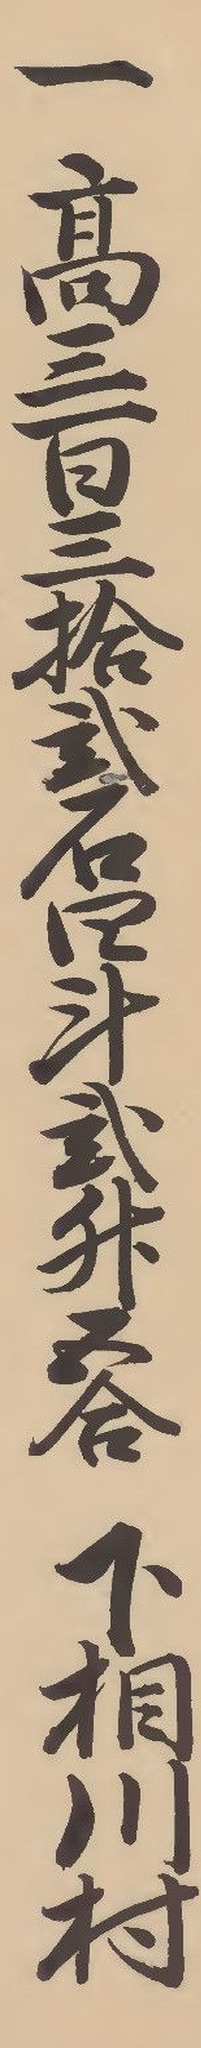一高三百三拾弐石四斗弐升五合下相川村
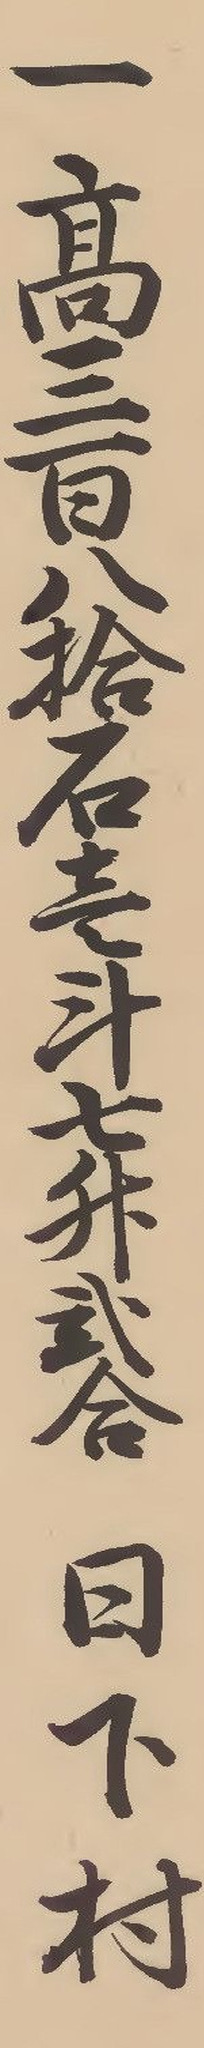一高三百八拾石壱斗七升弐合日下村
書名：越後国郷帳　下
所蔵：国立公文書館 National Archives of Japan
